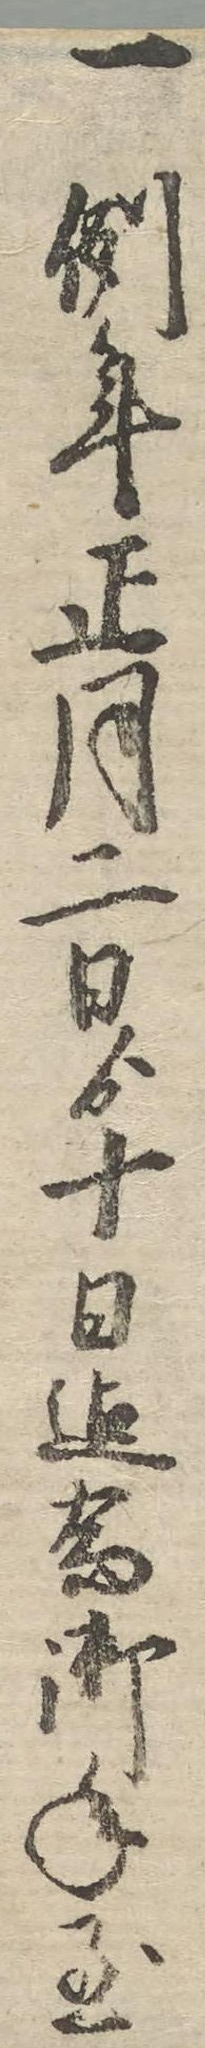一例年正月二日ゟ十日迠為御年玉
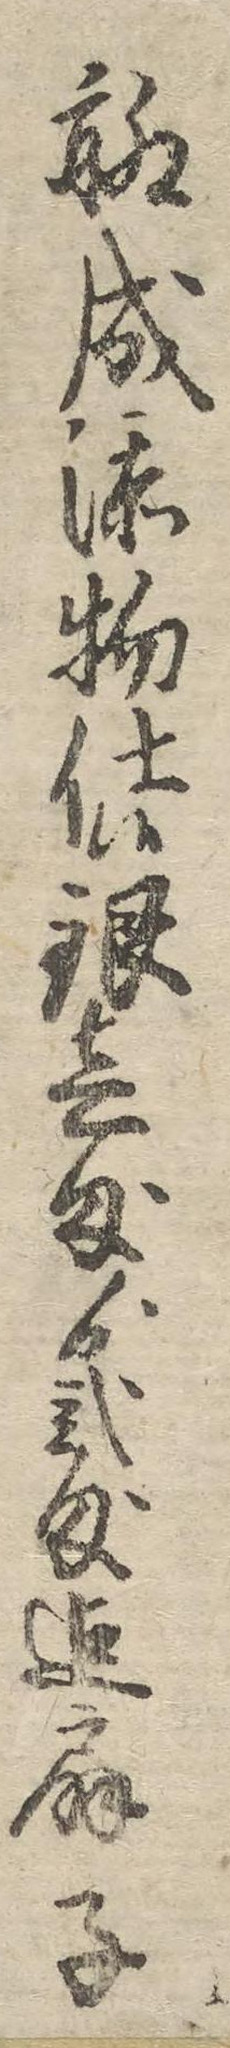聊成添物仕候銀壱匁ゟ弐匁迠扇子
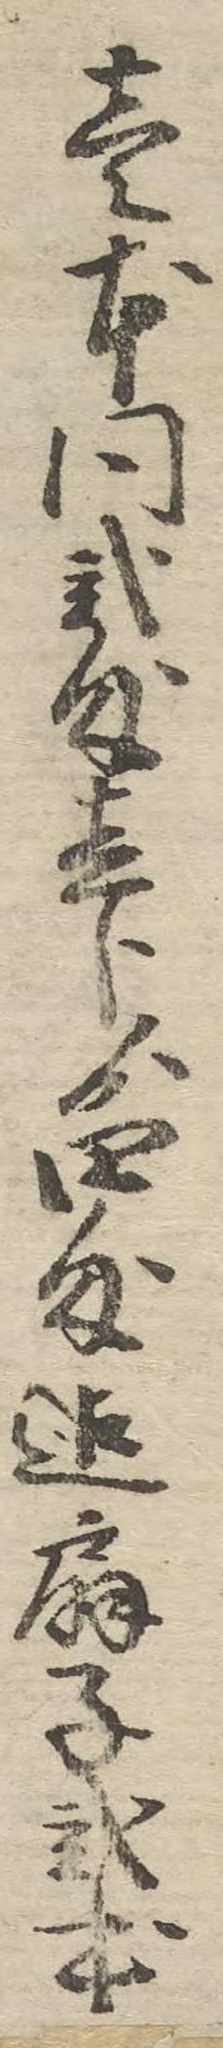壱本同弐匁壱分ゟ四匁迠扇子弐本
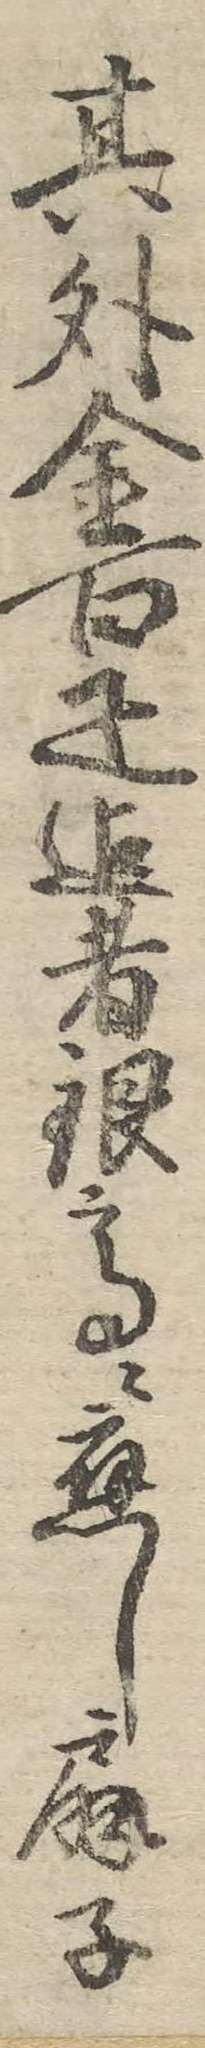其外金百疋迠者銀高に応し扇子
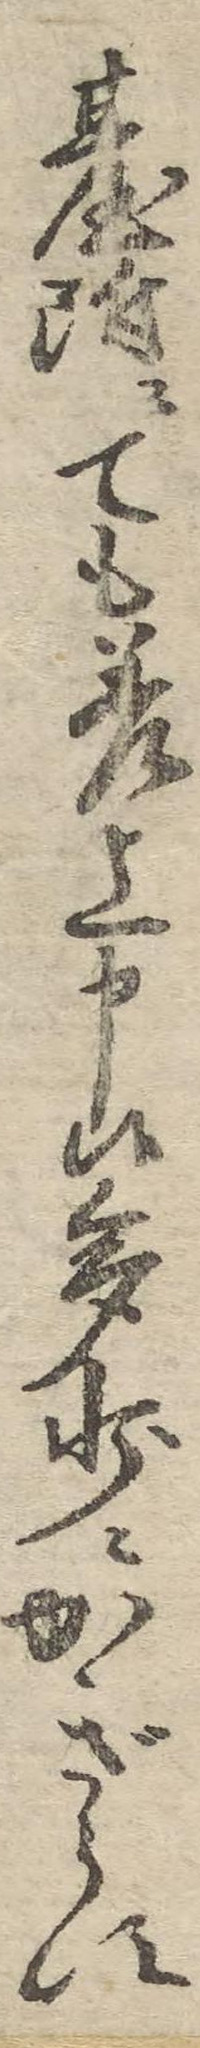臺附にても差上申候多少にかぎらす
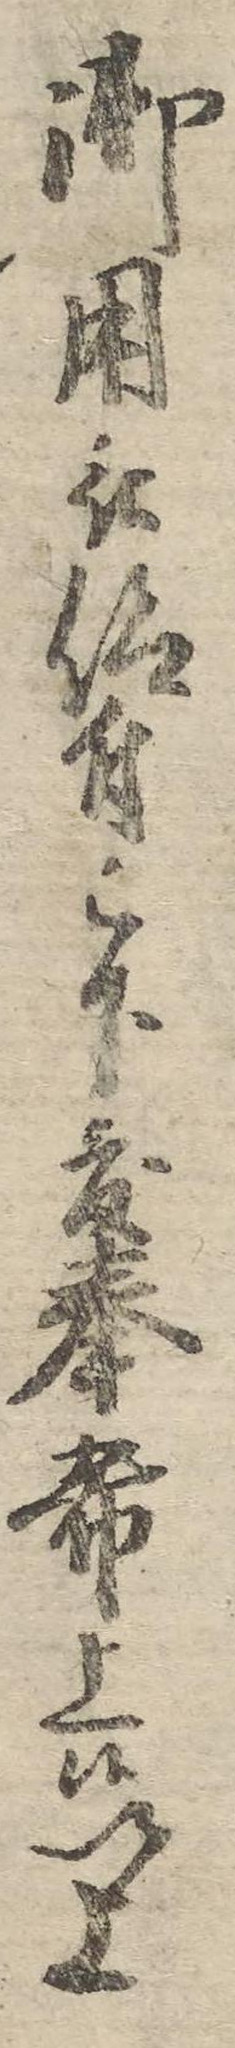御用被仰付被下度奉希上候以上
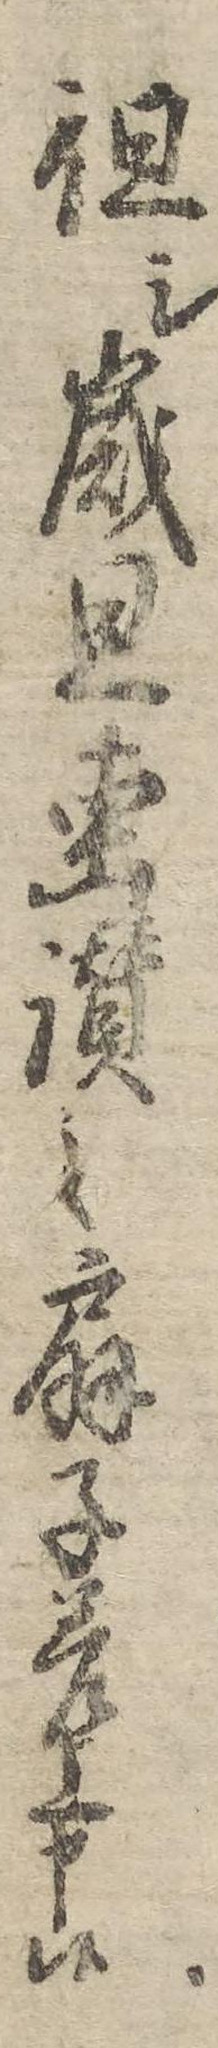但し歳旦画讃之扇子差上申候
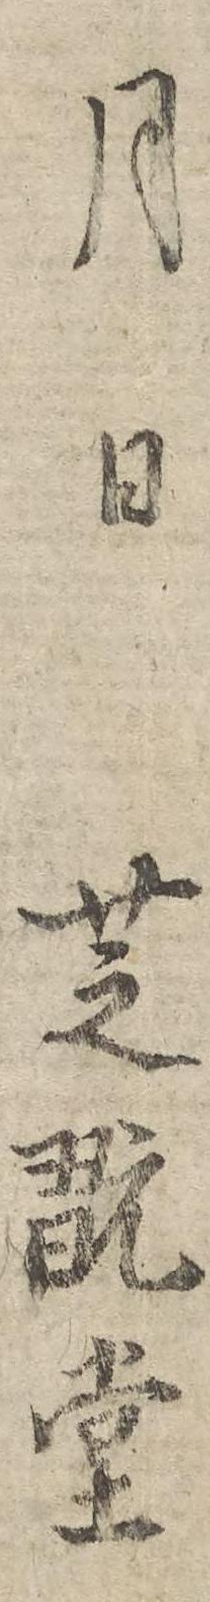月日芝翫堂
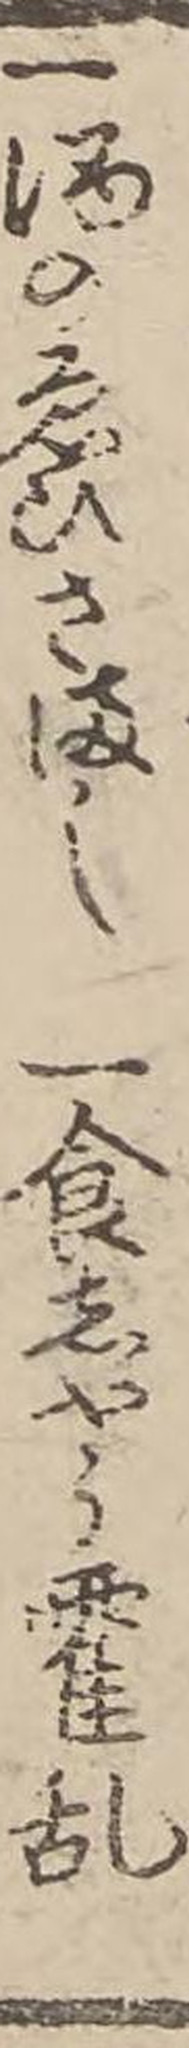一酒のゑひさまし一食しやう霍乱
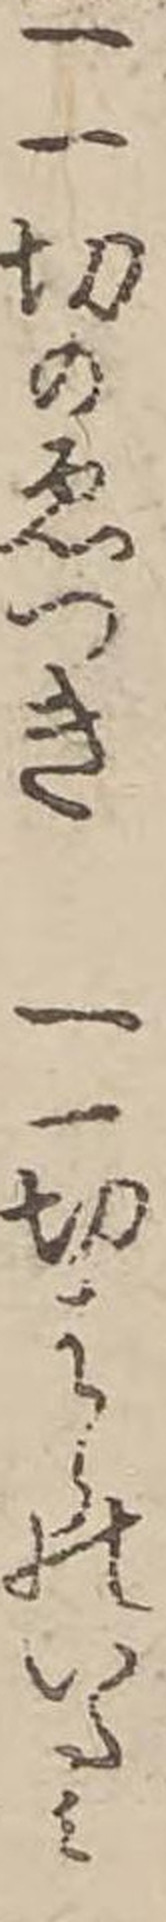一一切のゑつき一一切はらのいたみ
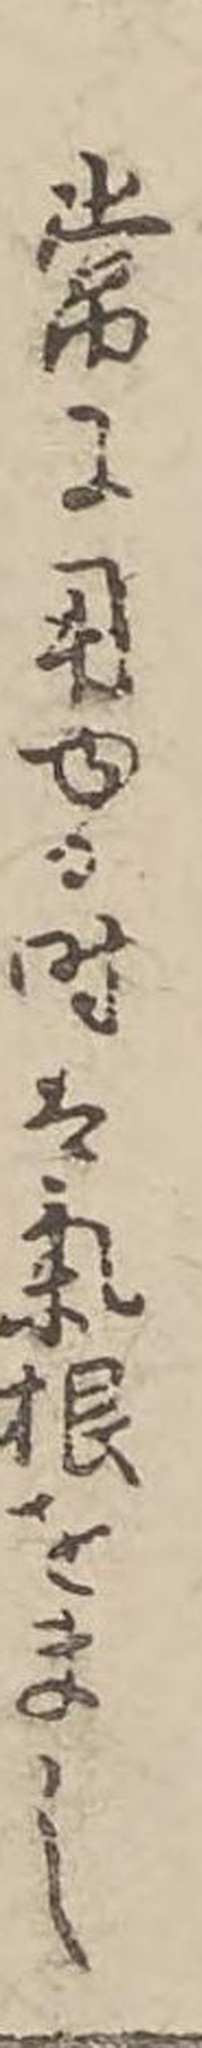常に用ゆる時は気根をまし
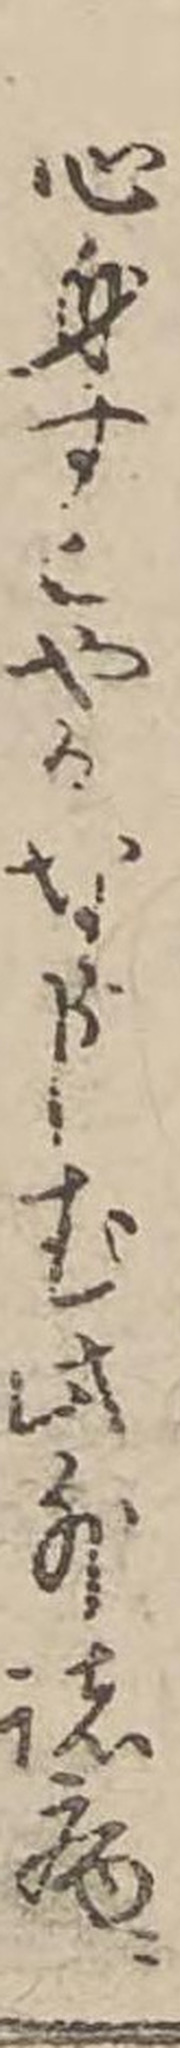心身すこやかならしむ此外諸病に
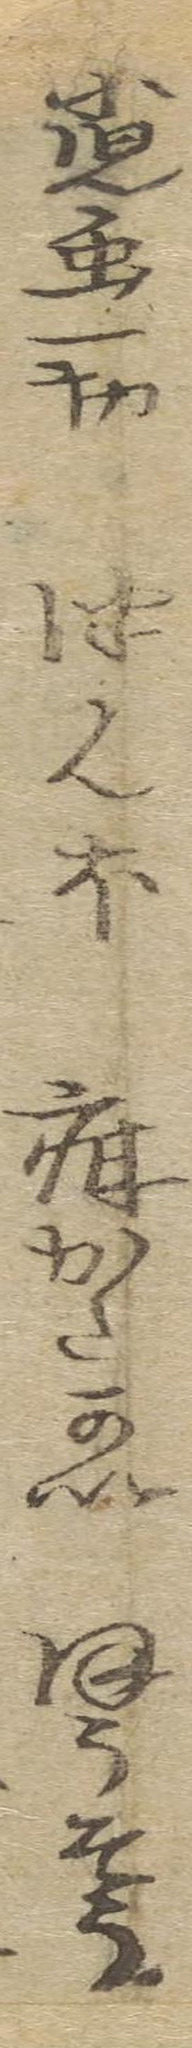小児虫一切つんほ疳かたかいほうそう
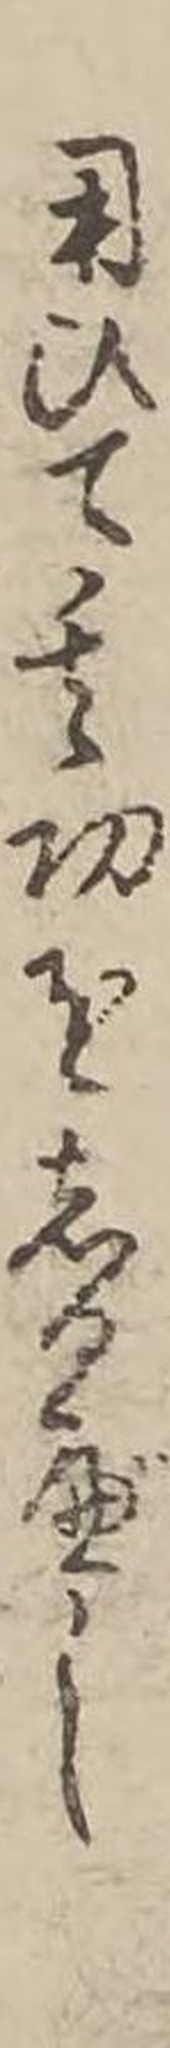用ひて其功をしるべし
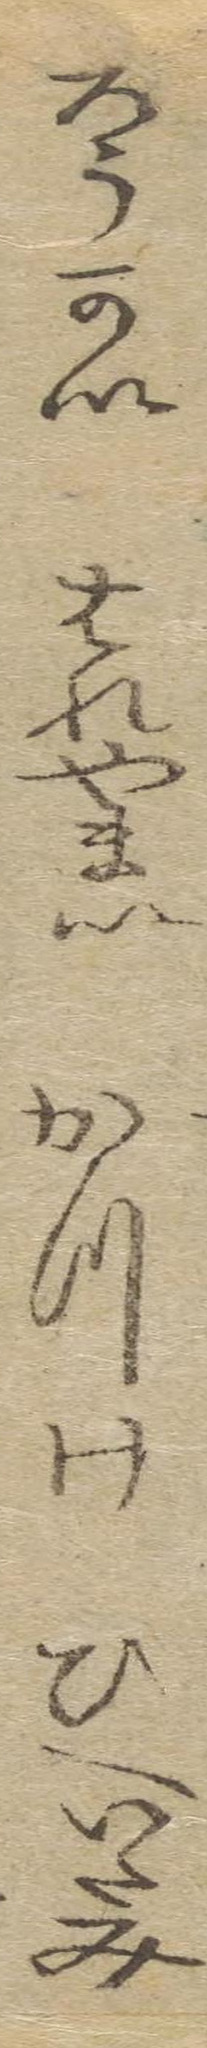ろうかいはれやまいかつけひへいたみ
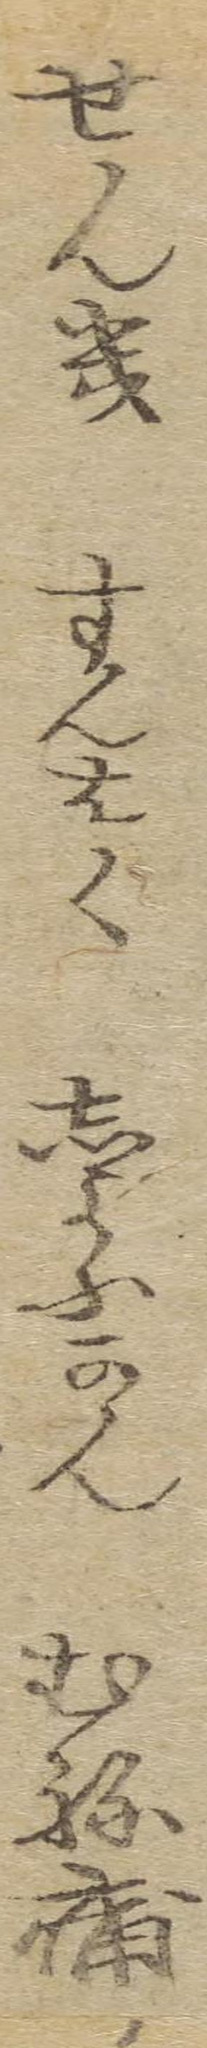せんきすんはくしよふかんむね痛
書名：浪華薬種問屋能書張交帖. 二
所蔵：国立国会図書館 National Diet Library, JAPAN
